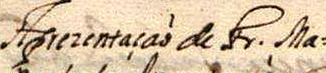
Aprezentaçaõ de Fr. Ma
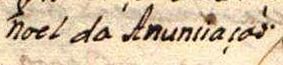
noel da Anunciaçaõ.
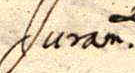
Juram.to
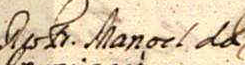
Reo Fr. Manoel da
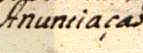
Anunciaçaõ.
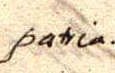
patria.
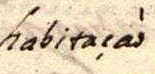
habitaçaõ
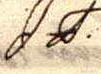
Id̄.e
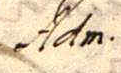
Adm.
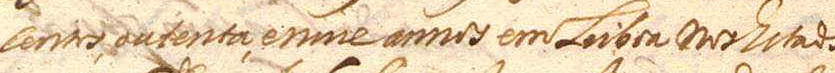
centos, outenta, e noue annos em Lisboa nos Estaos
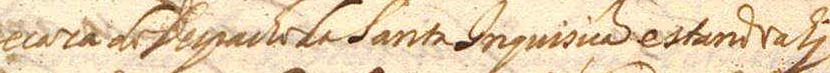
e caza do Despacho da Santa Inquisição estando ahj
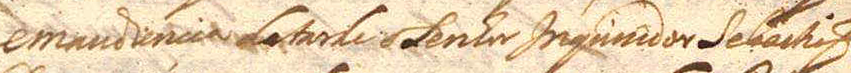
em audiençia da tarde o Senhor Jnquisidor Sebastiaõ
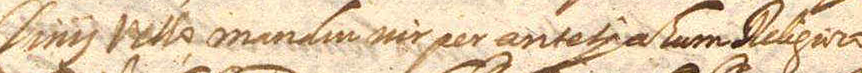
Dinis Velho, mandou uir perante sj a hum Religiozo
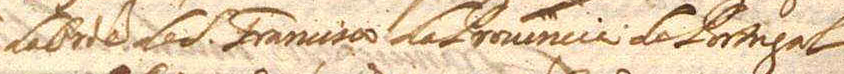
da Ordē de S. Françisco da Prouinçia de PortugaL
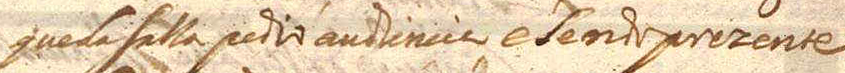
que da salla pedio audiençia, e sendo prezente
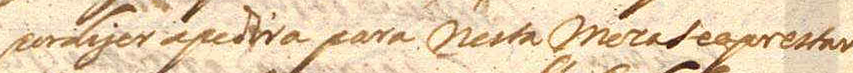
por dizer a pedira para nesta meza se aprestar
